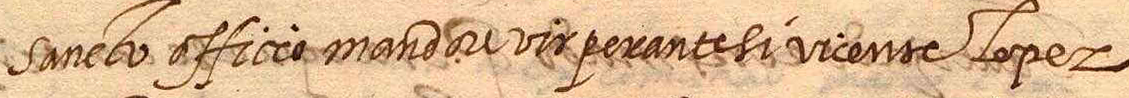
Sancto officio mandou vir perante si vicente Lopez
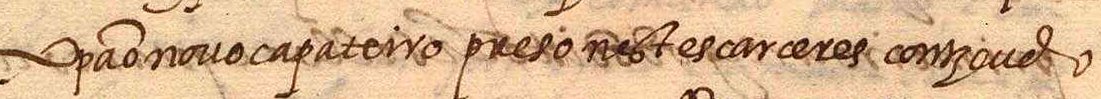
Xpaõ nouo capateiro preso nestes carceres contheudo
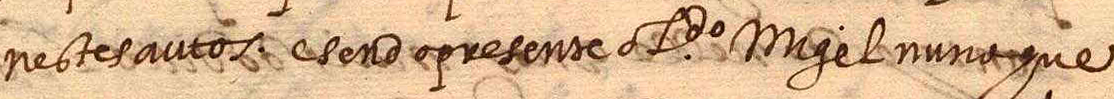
nestes autos e sendo presente o L.do Migel nuno que
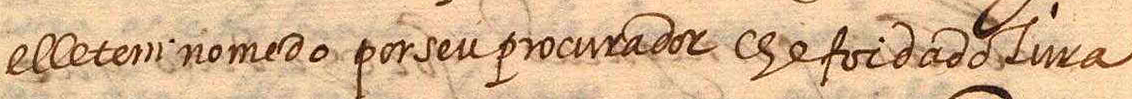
elle tem nomedo por seu procurador lhe foi dado Iura
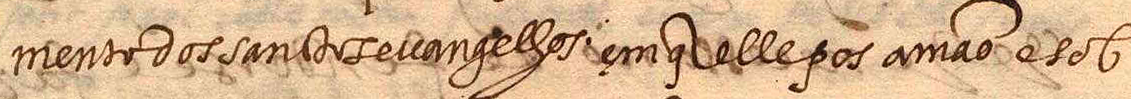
mento dos sanctos euangelhos em q̄ elle pos a mão e sob
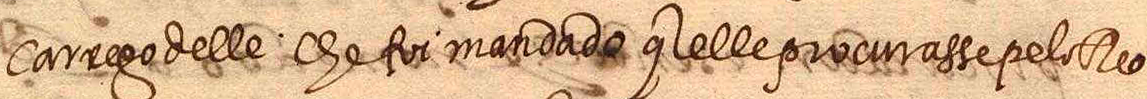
carrego delle lhe foi mandado q̄ elle procurasse pelo Reo
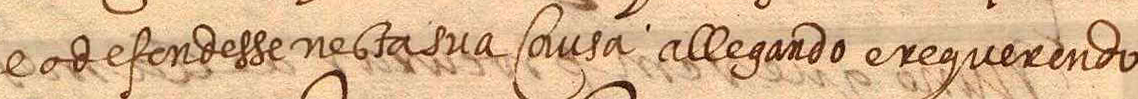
e o defendesse nesta sua Causa allegando e requerendo
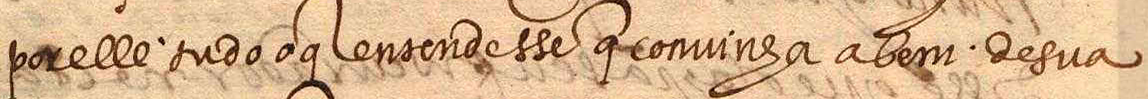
por elle tudo o q̄ entendesse q̄ conuinha a bem . de sua
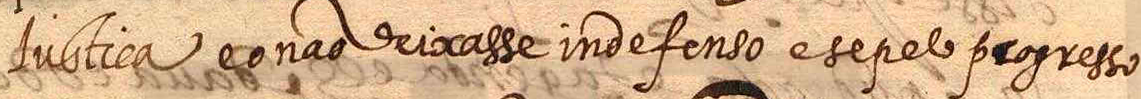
Iustica e o não deixasse indefenso e se pelo progresso
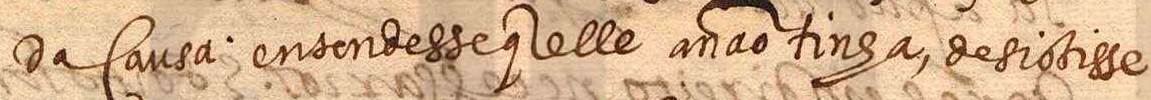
da Causa entendesse q̄ elle a não tinha, desistisse
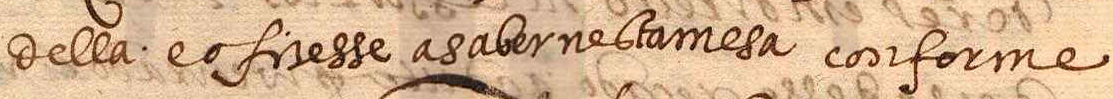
della e o fizesse a saber nesta mesa conforme
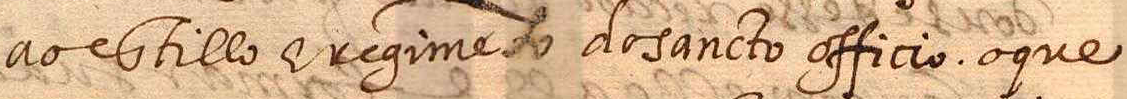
ao estillo E regimēto do sancto officio. o que
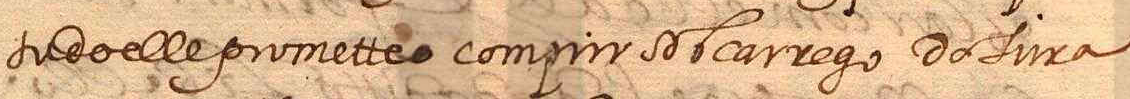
tudo elle prometteo comprir sob carrego do Iura
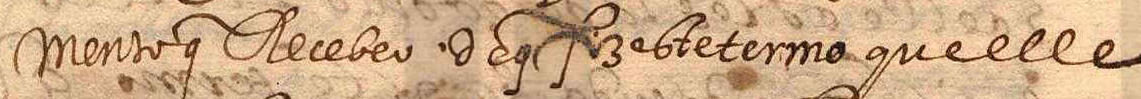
mento q̄ Recebeo de q̄ fiz este termo que elle
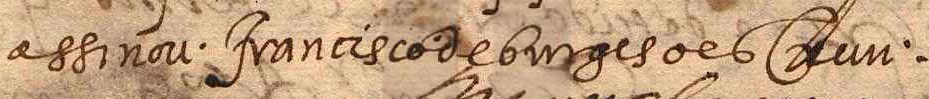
assinou. francisco de bruges o esCreui.
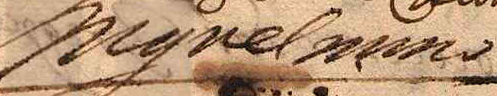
Miguel Nuno
